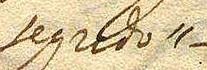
segredo //
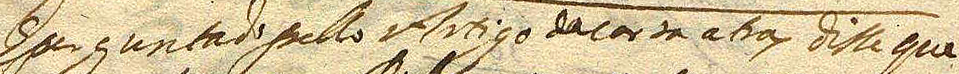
E perguntado pello Artigo da carta atras disse que
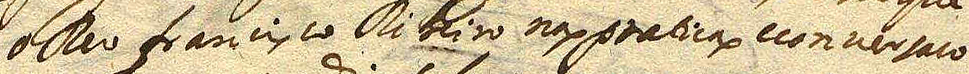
o Reo francisco Ribeiro nas praticas e conuersaco
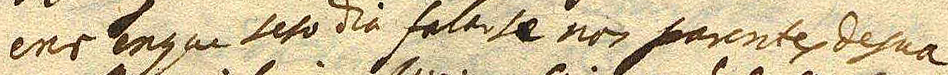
ens en que sesodia falarse nos parentes de sua
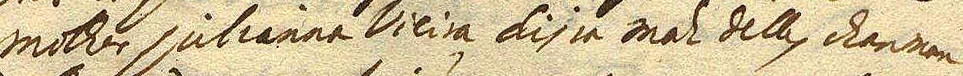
molher julianna Vieira disia mal delles chanman
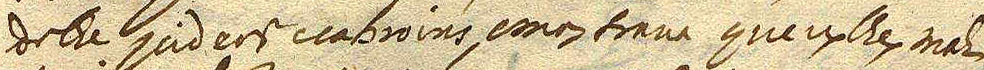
dolhe judeos e cabroiñs, e mostraua quererlhes maL
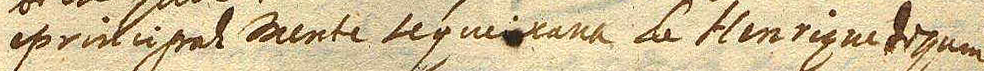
e principalmente se queixaua de Henrique do quin
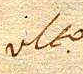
vlt.o
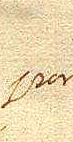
jur
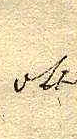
vlt.o
